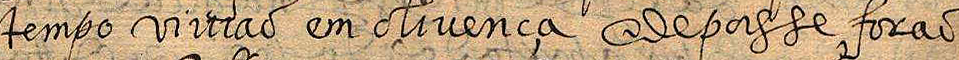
tempo viuiaõ em oliuença e depois se foraõ
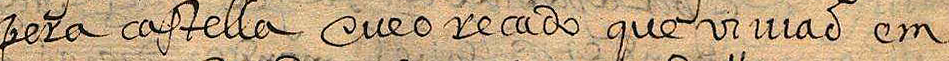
pera castella e ueo recado que viuiaõ em
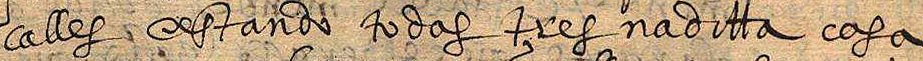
calles e estando todas tres na ditta casa
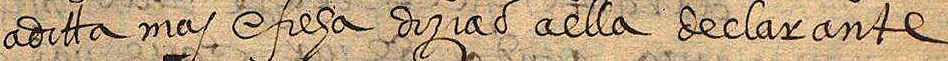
a ditta mai e filha diziaõ a ella declarante
